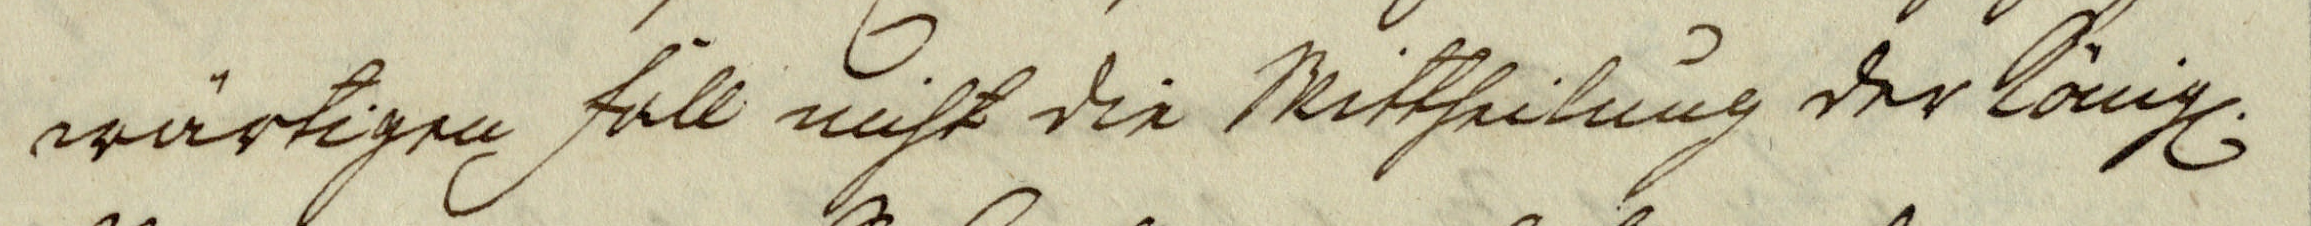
wärtigen Fall nicht die Mittheilung der Königl.
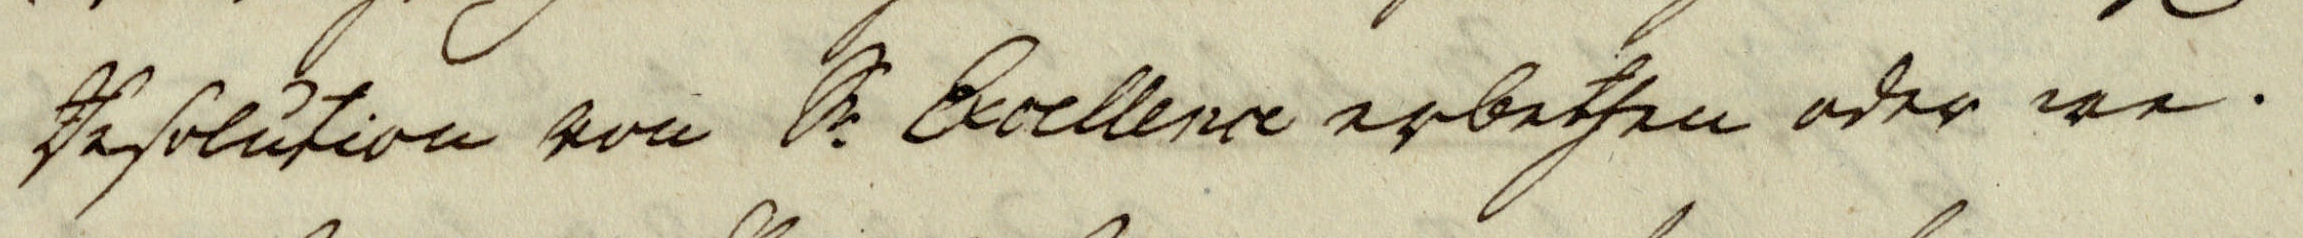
Resolution von Sr. Excellence erbethen oder we¬
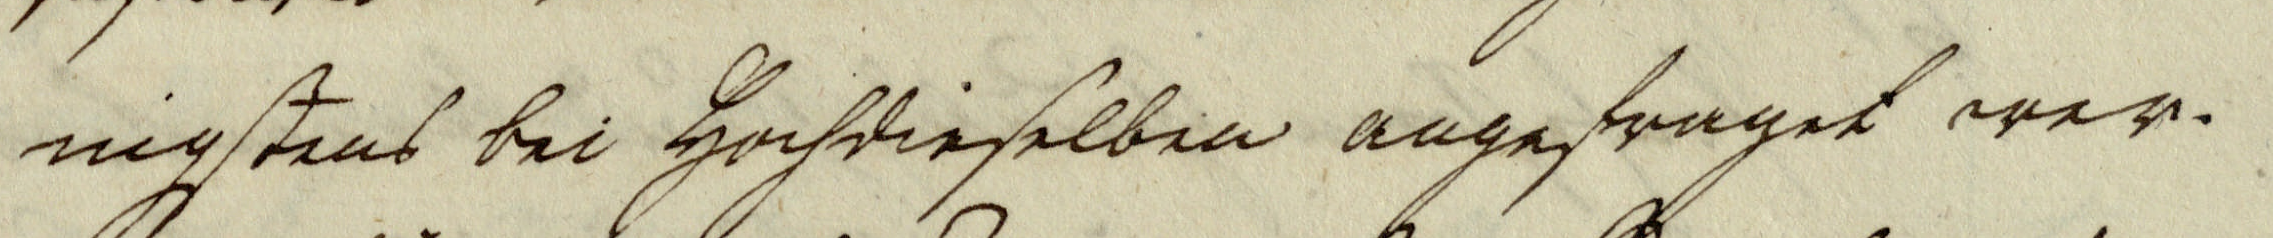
nigstens bei Hochdieselben angefragt wer¬
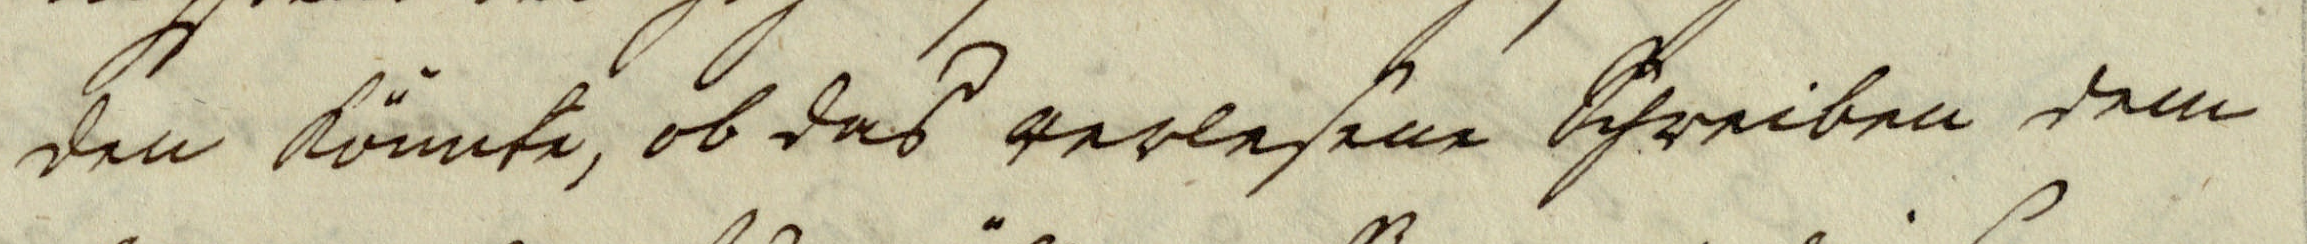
den könnte, ob das verlesene Schreiben dem
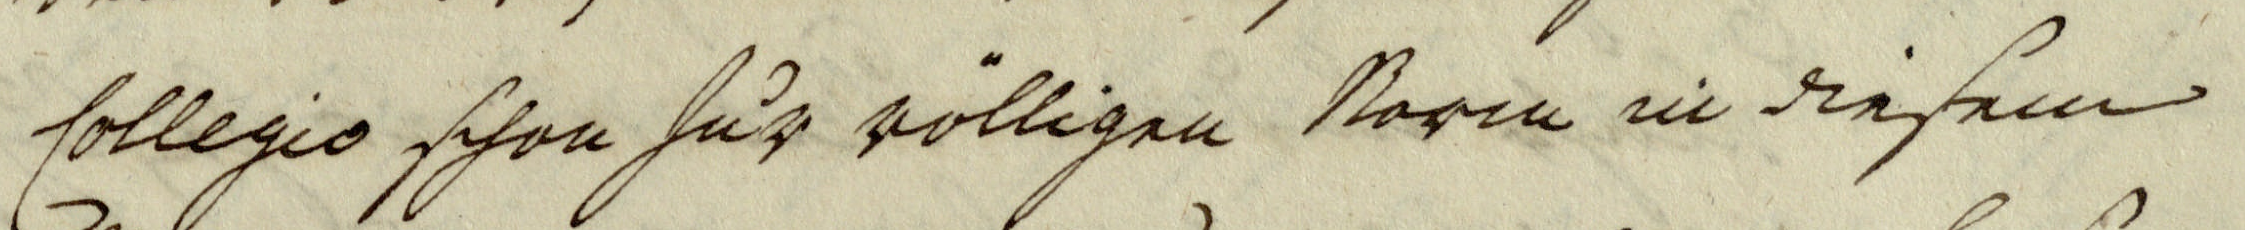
Collegio schon zur völligen Norm in diesem
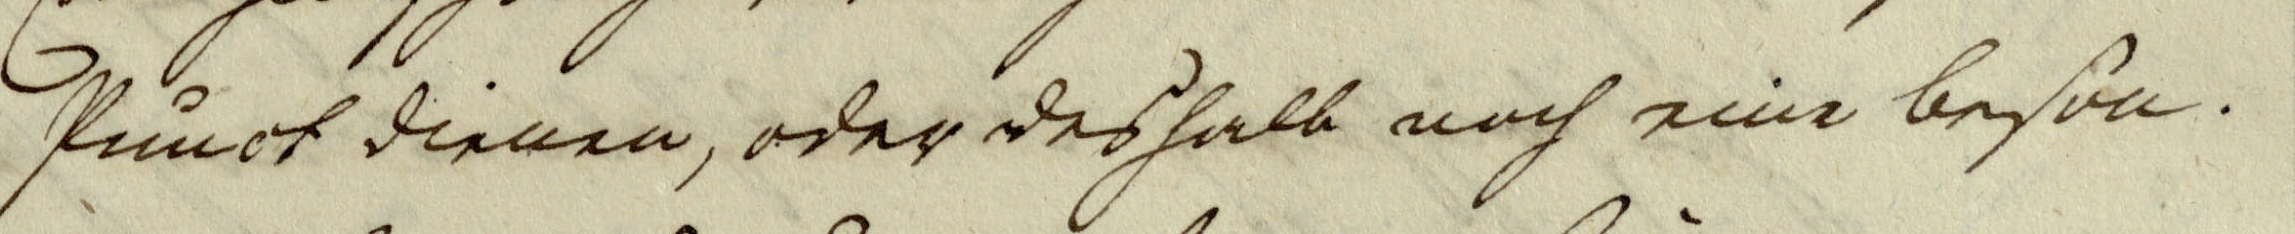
Punct dienen, oder deshalb noch eine beson¬
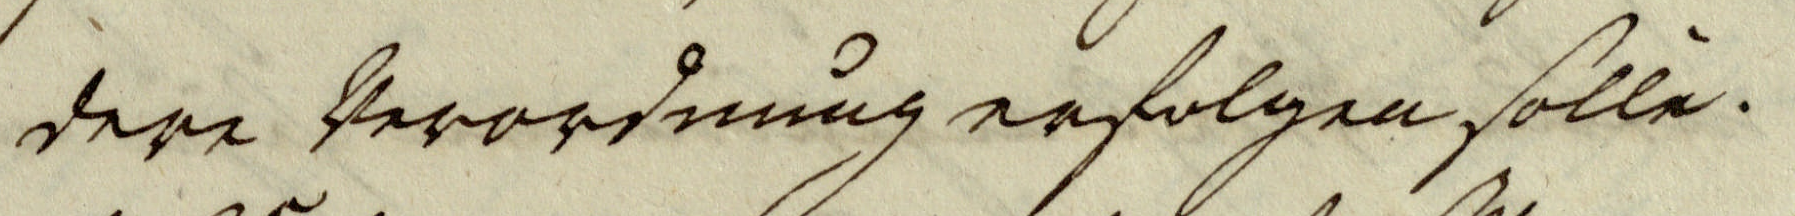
dere Verordnung erfolgen solle.
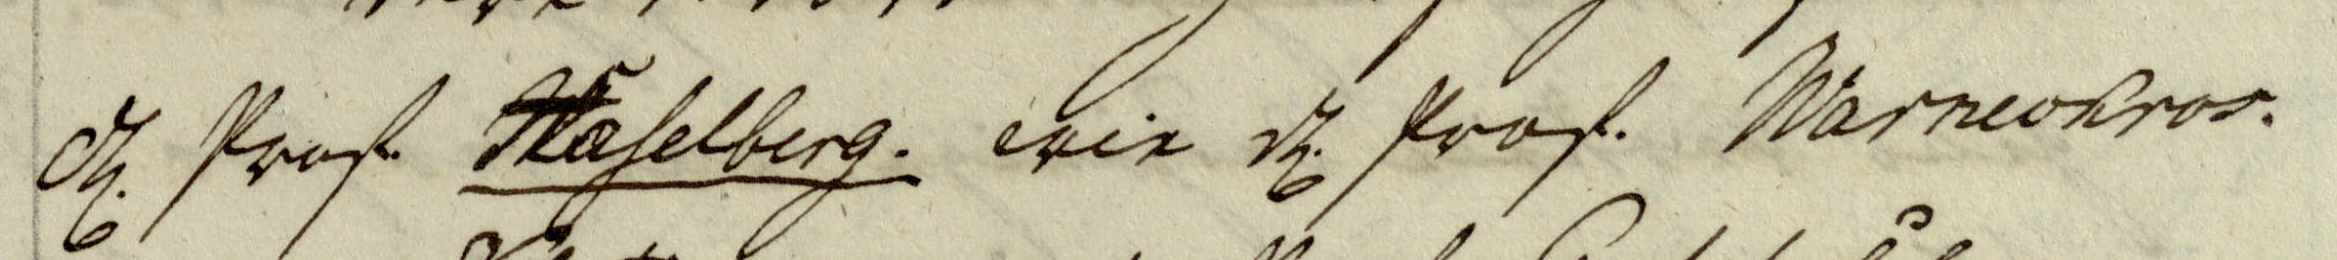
dh. Prof. Haselberg. wie dh. Prof. Warneckros.
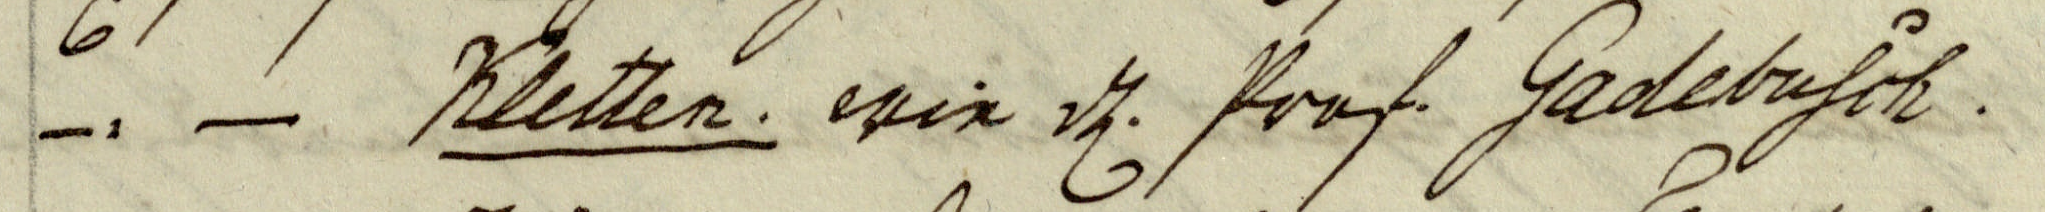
— " — Kletten. wie dh. Prof. Gadebusch.
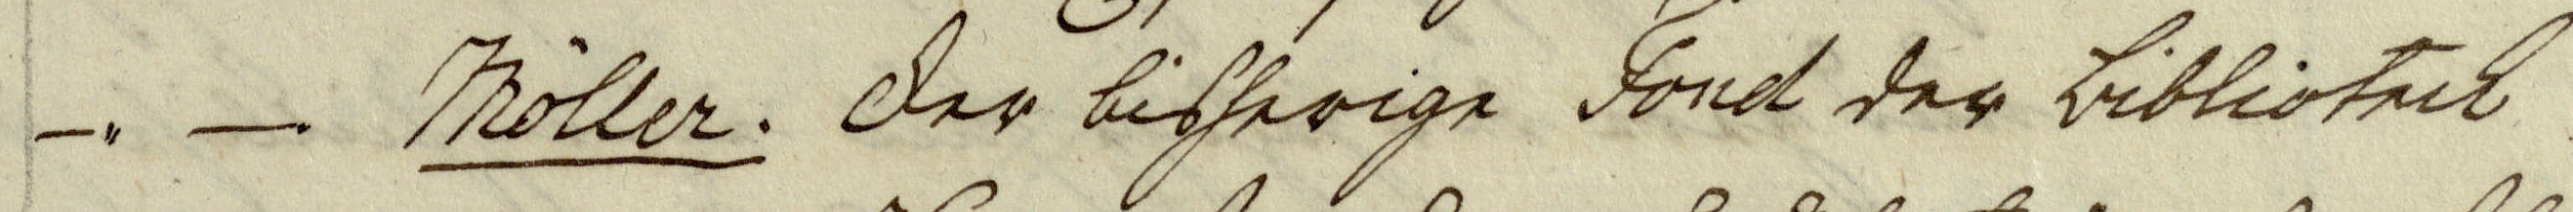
— " — Möller. Der bisherige Fond der Bibliotek
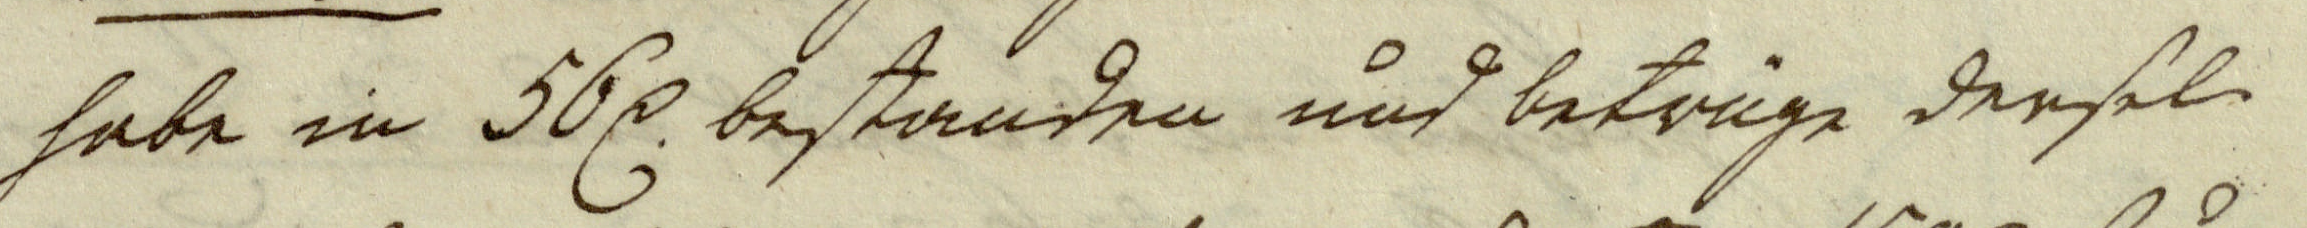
habe in 50 rtl. bestanden und betrüge dersel¬
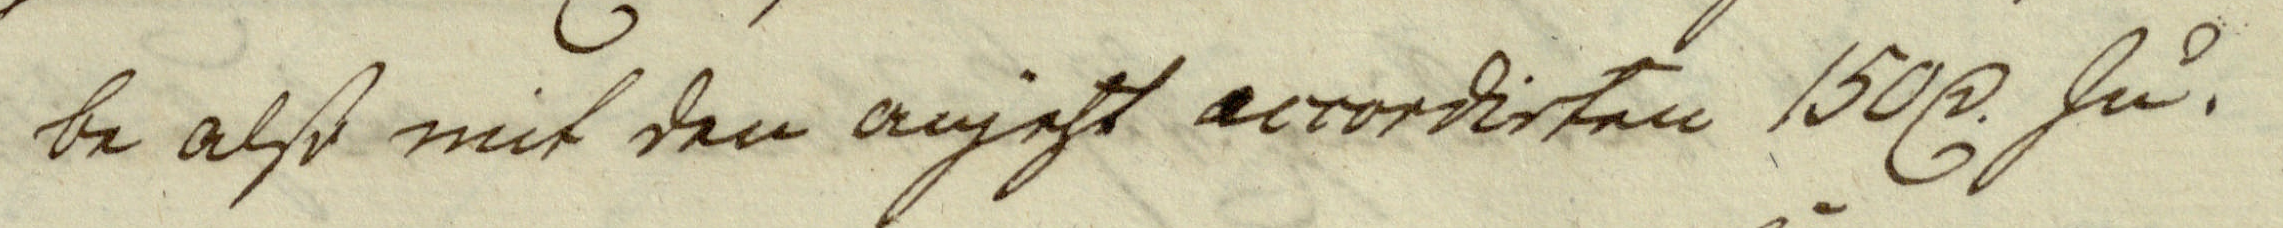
be alß mit den anjetzt accordirten 150 rtl. zu¬
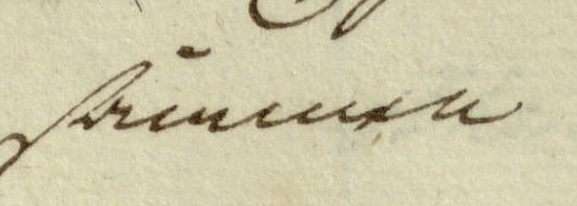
sammen
